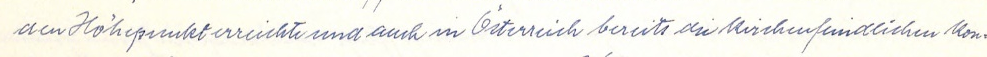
den Höhepunkt erreichte und auch in Österreich bereits die kirchenfeindlichen kon-
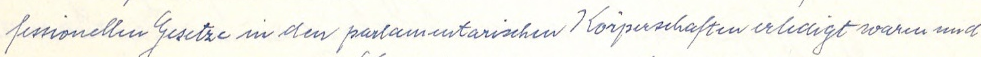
fessionellen Gesetze in den parlamentarischen Körperschaften erledigt waren und
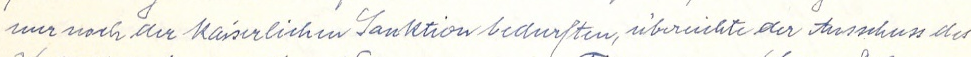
nur noch der Kaiserlichen Sanktion bedurften, übereichte der Ausschuss des
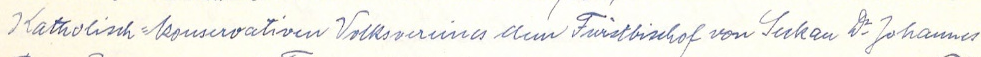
Katholisch-konservativen Volksvereines dem Fürstbischof von Seckau Dr Johannes
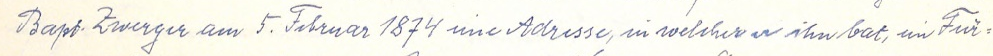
Bapt. Zwerger am 5. Februar 1874 eine Adresse, in welcher er ihn bat, ein Für-
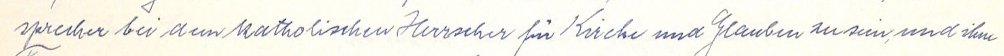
sprecher bei dem katholischen Herrscher für Kirche und Glauben zu sein und ihm
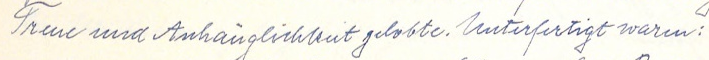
Treue und Anhänglichkeit gelobte. Unterfertige waren:
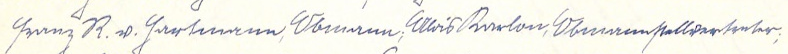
Franz R. v. Hartmann, Obmann; Alois Karlon, Obmannstellvertreter;
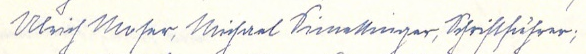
Ulrich Muser, Michael Simettinger, Schriftführer;
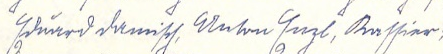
Eduard Damisch, Anton Enzl, Kassier;
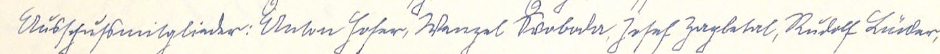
Ausschussmitglieder: Anton Hofer, Wenzel Srobader, Josef Zagletat, Rudolf Lüder,
